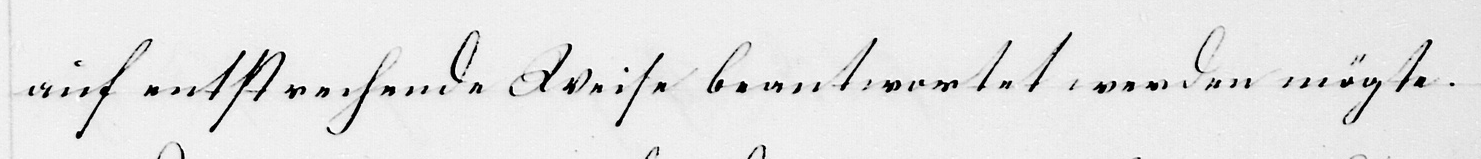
auf entsprechende Weise beantwortet werden mögte.
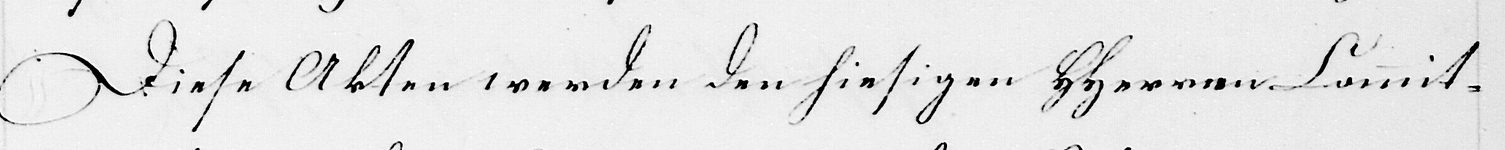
Diese Akten werden den hiesigen HHerren Commit¬
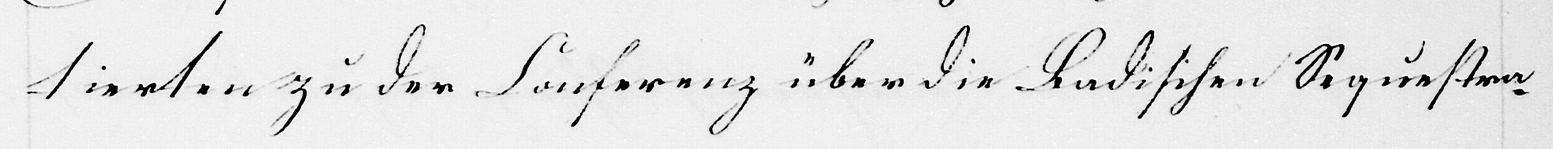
tierten zu der Conferenz über die Badischen Sequestra¬
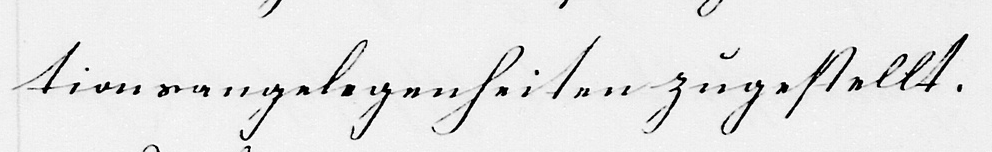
tionsangelegenheiten zugestellt.
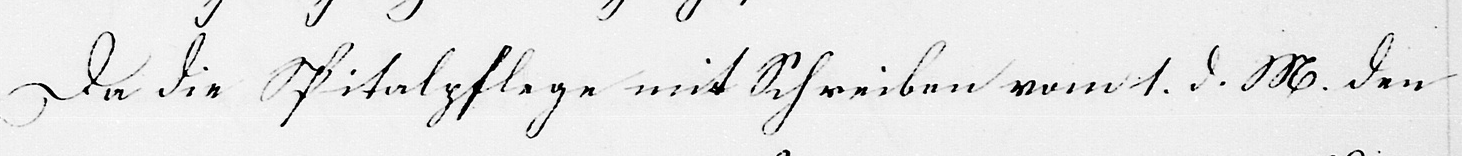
Da die Spitalpflege mit Schreiben vom 1. d. M. den
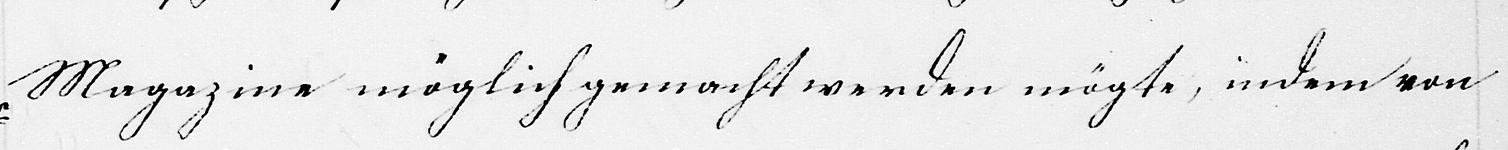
agazine möglich gemacht werden mögte, indem von
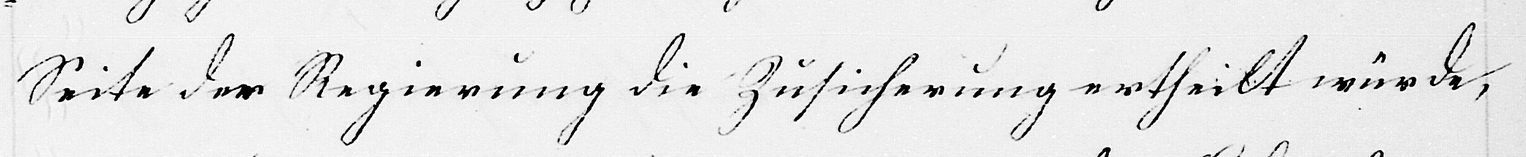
Seite der Regierung die Zusicherung ertheilt würde,
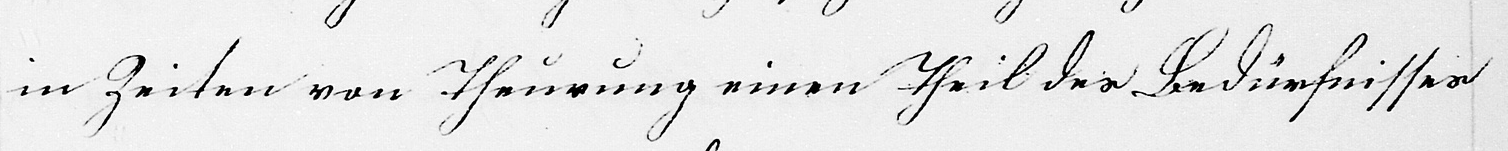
in Zeiten von Theurung einen Theil des Bedürfnisses
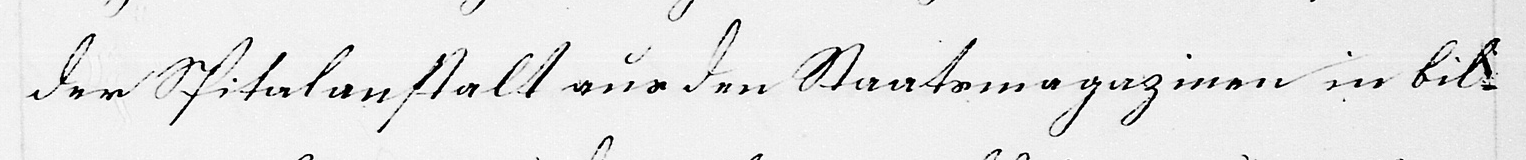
der Spitalanstalt aus den Staatsmagazinen in bil¬
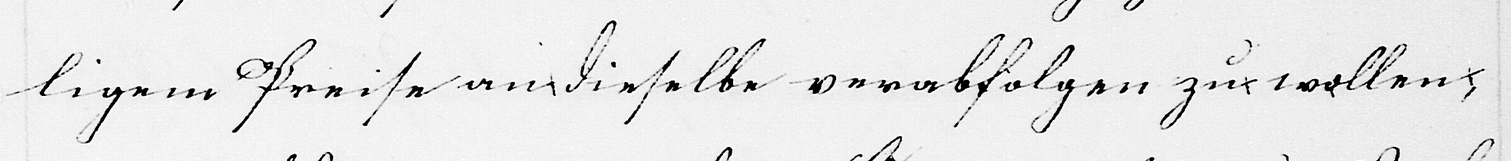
ligem Preise an dieselbe verabfolgen zu wollen,
